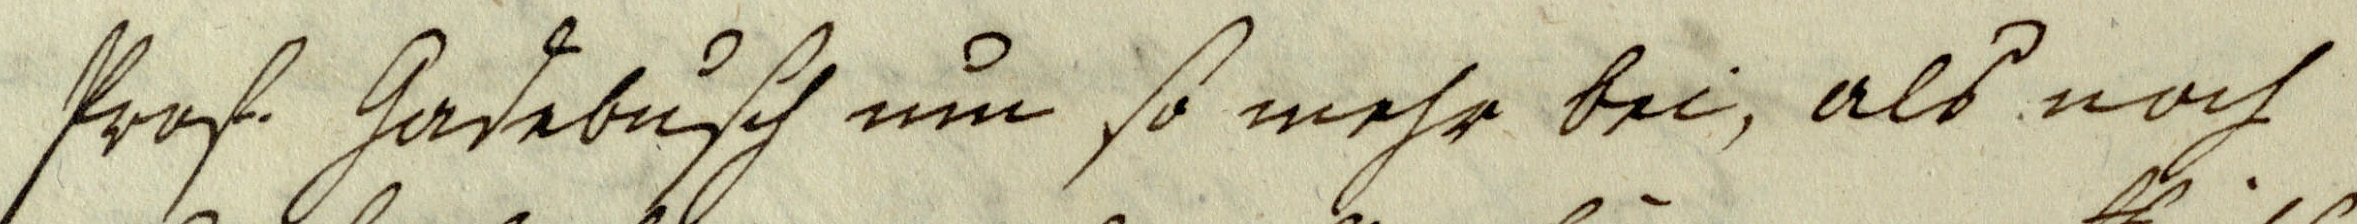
Prof. Gadebusch um so mehr bei, als noch
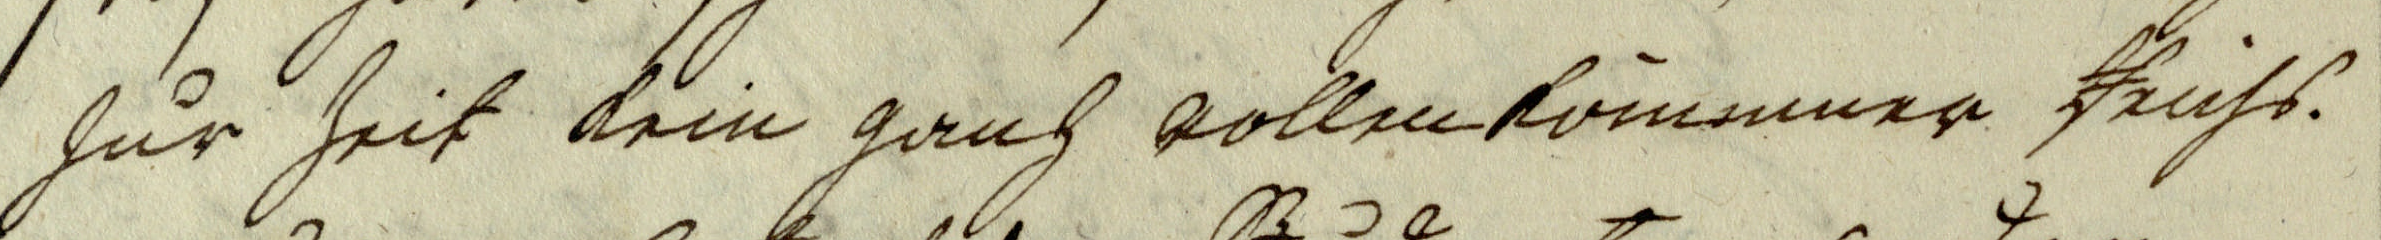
zur Zeit kein ganz vollkommener Reichs¬
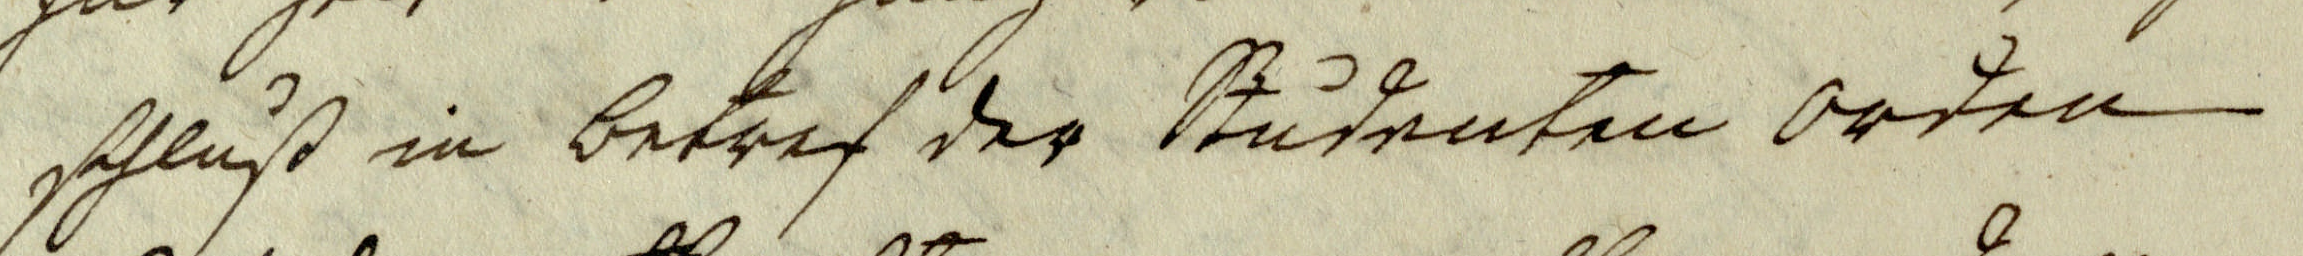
schluß in Betref der Studenten Orden
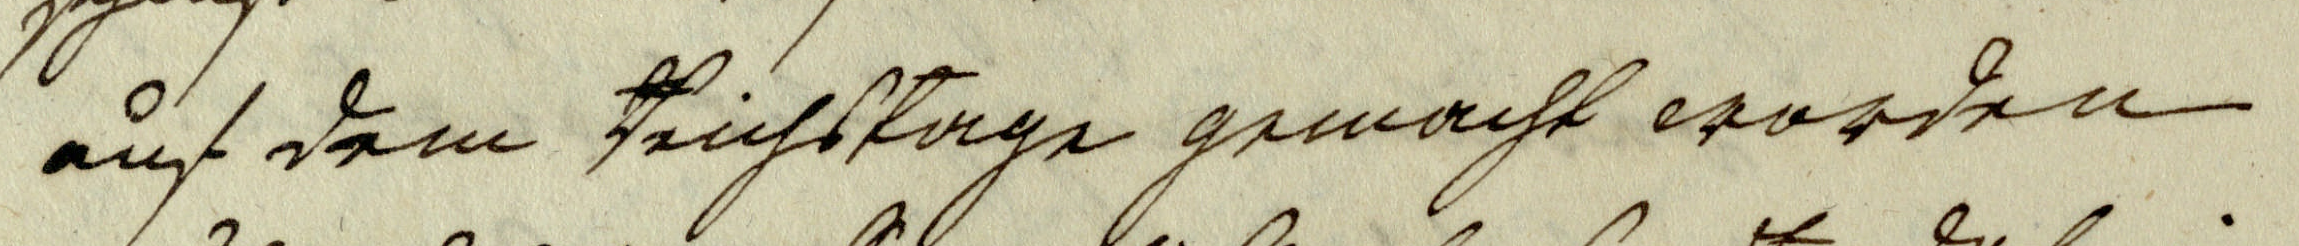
auf dem Reichstage gemacht worden
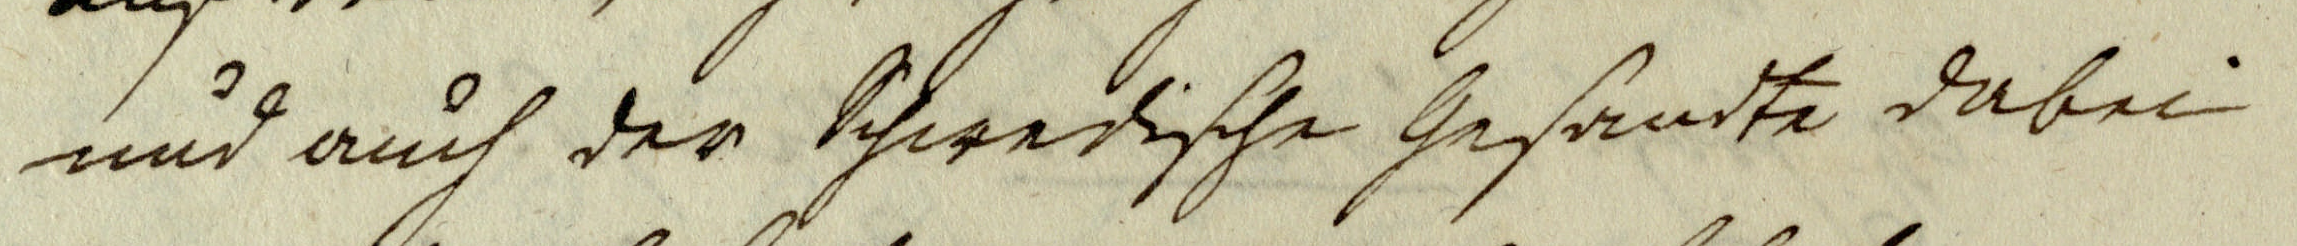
und auch der Schwedische Gesandte dabei
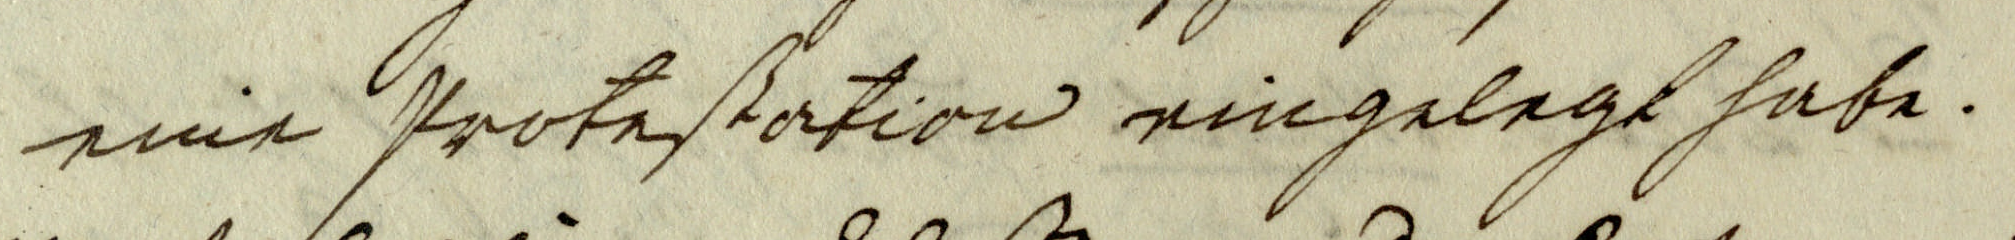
eine Protestation eingelegt habe.
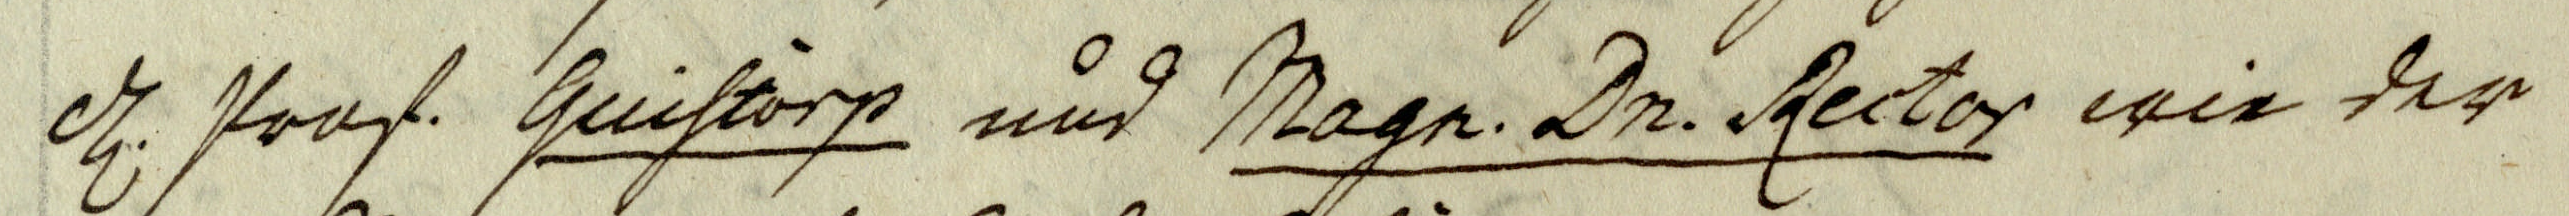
dh. Prof. Quistorp und Magn. Dn. Rector wie der
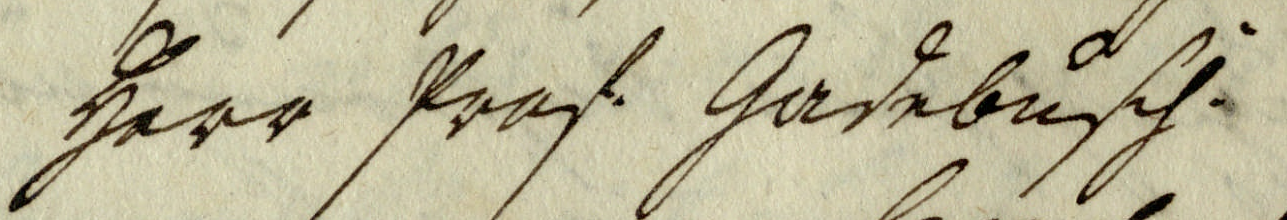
Herr Prof. Gadebusch.
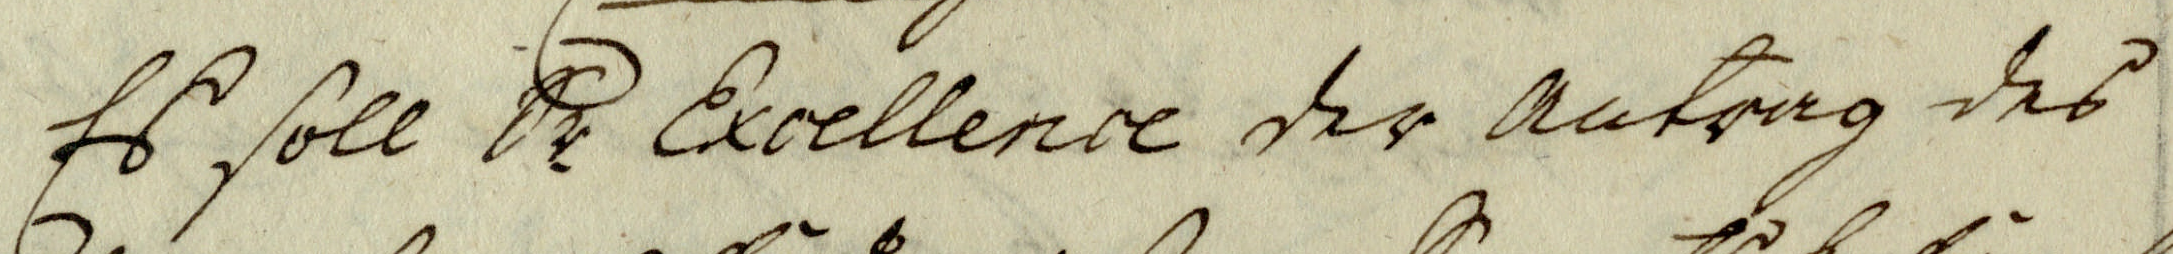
Es soll Sr. Excellence der Antrag des
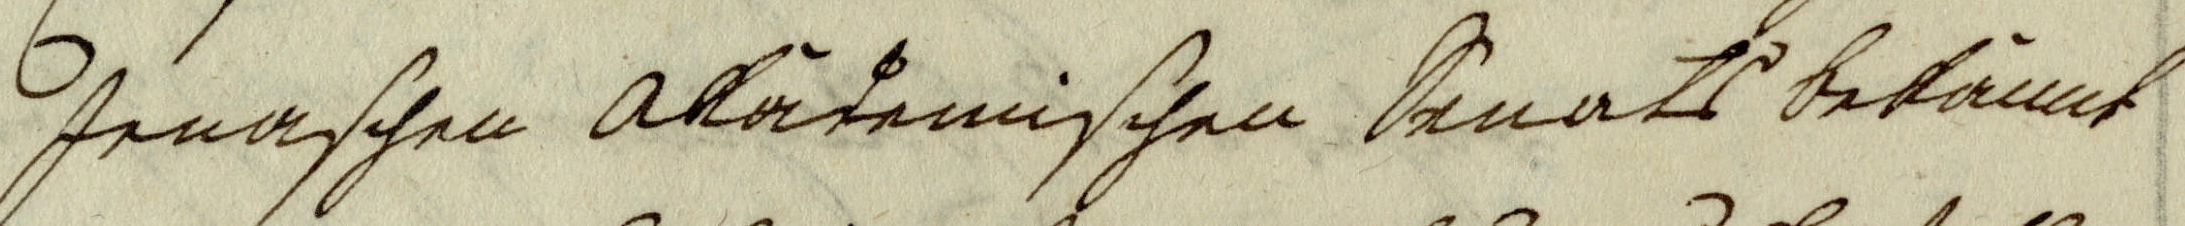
Jenaschen Akademischen Senats bekannt
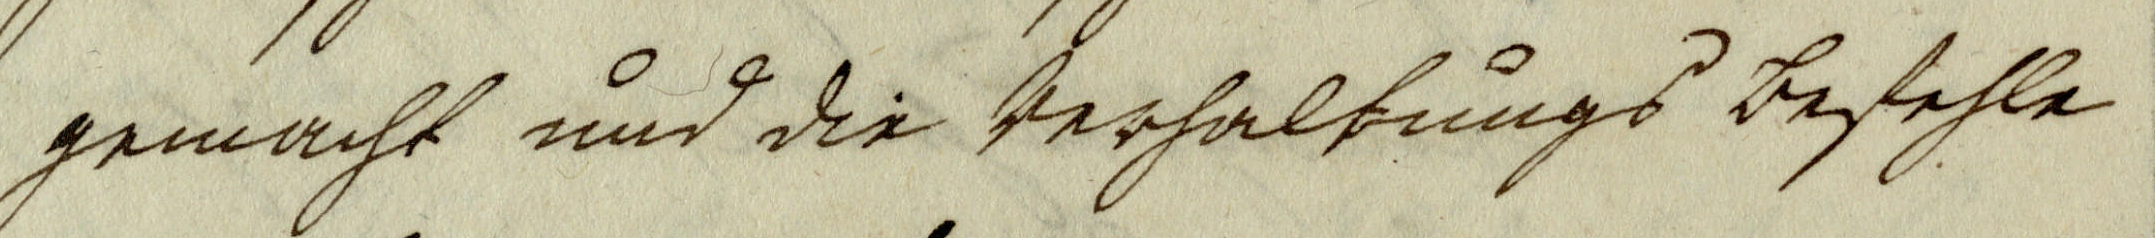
gemacht und die Verhaltungs Befehle
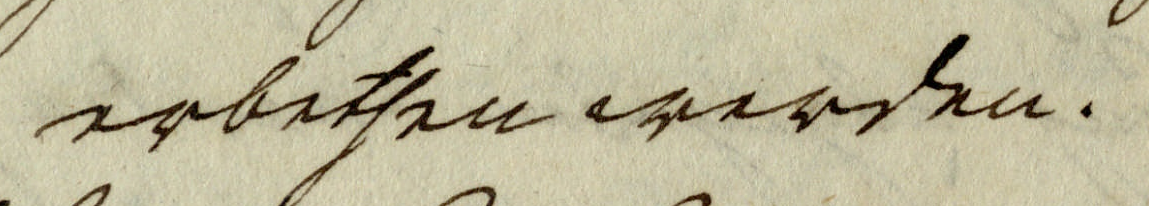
erbethen werden.
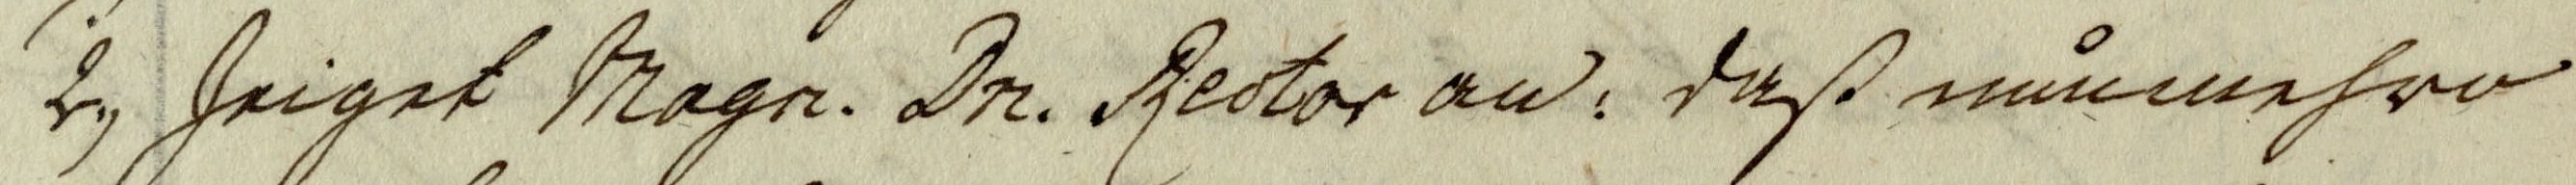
2., Zeiget Magn. Dn. Rector an: daß nunmehro
